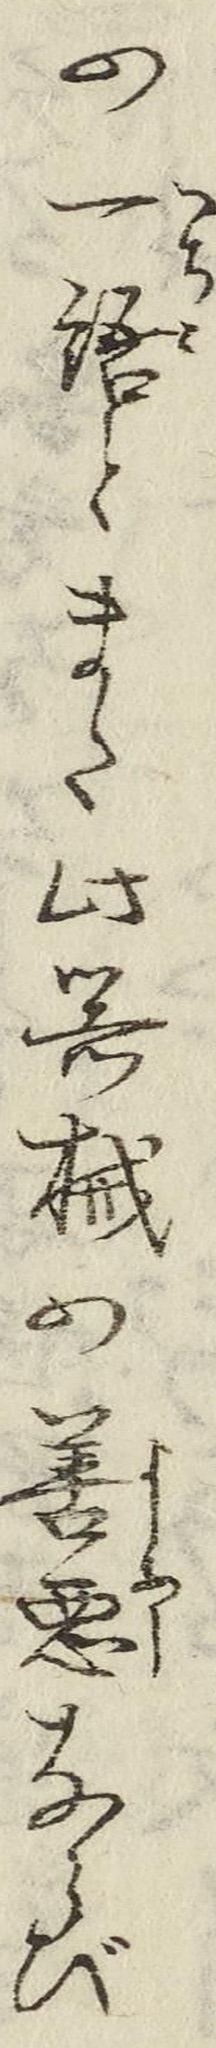の一語とまた此器械の善悪ならび
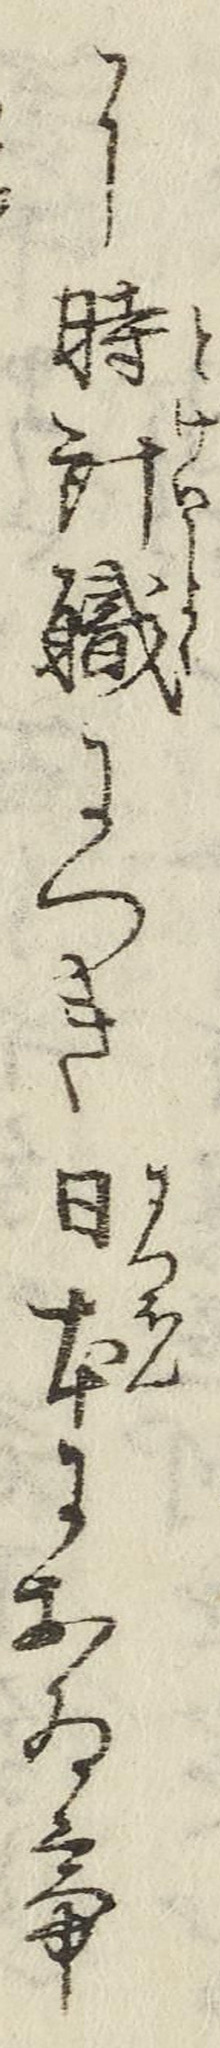に時計職につき日本におゐて
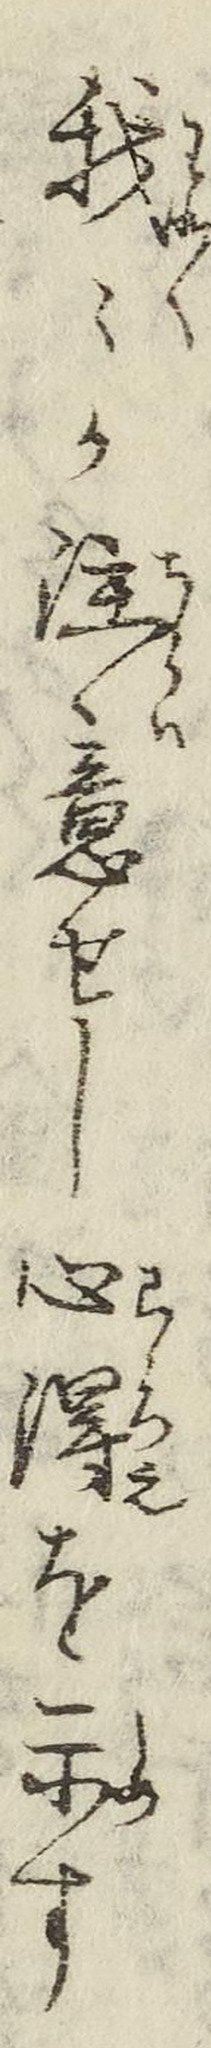我〻か注意をし心得を示す
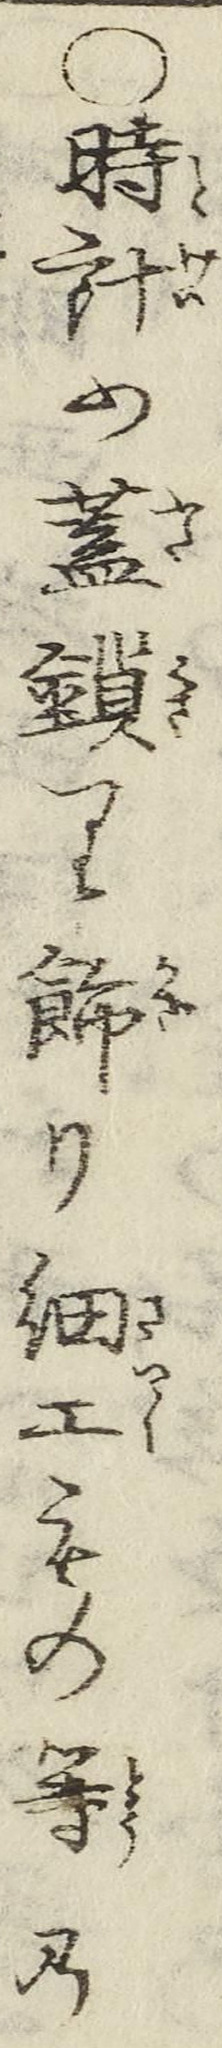〇時計の蓋鎖り飾り細工もの等の
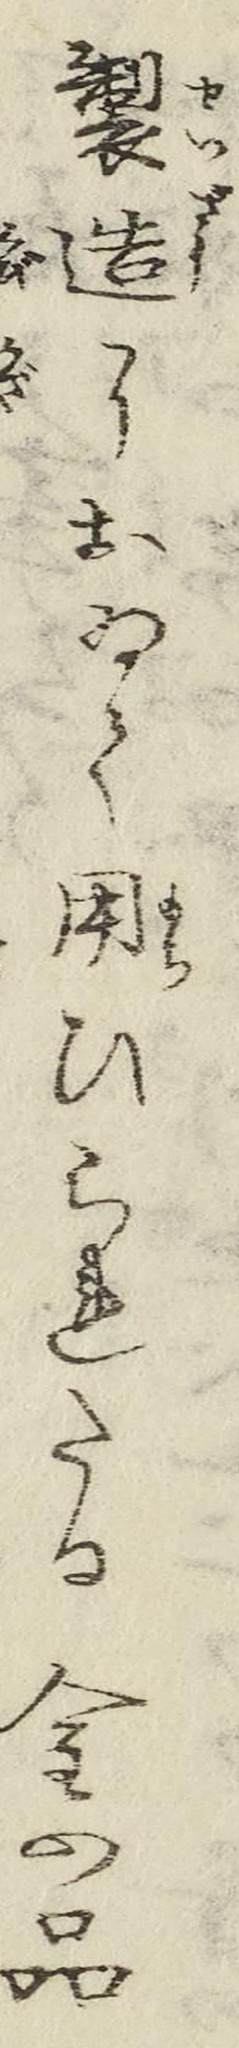製造におゐて用ひられたる金の品
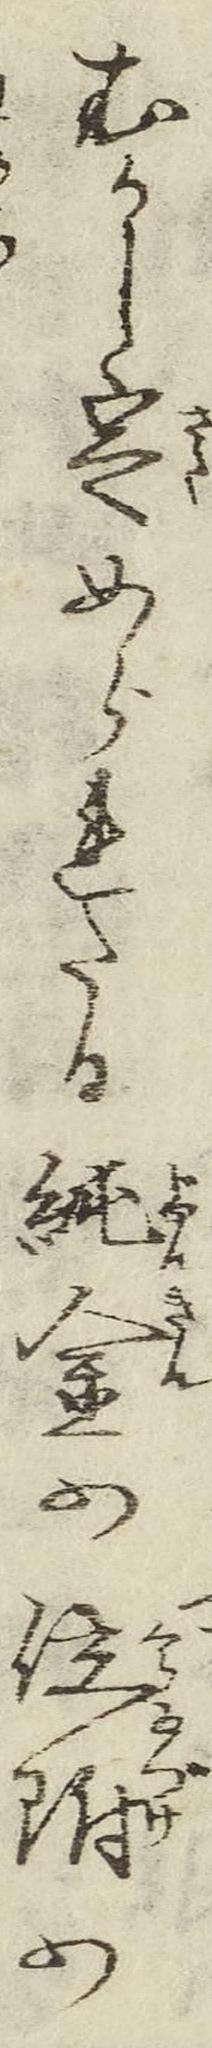むかし定められたる純金の位附の

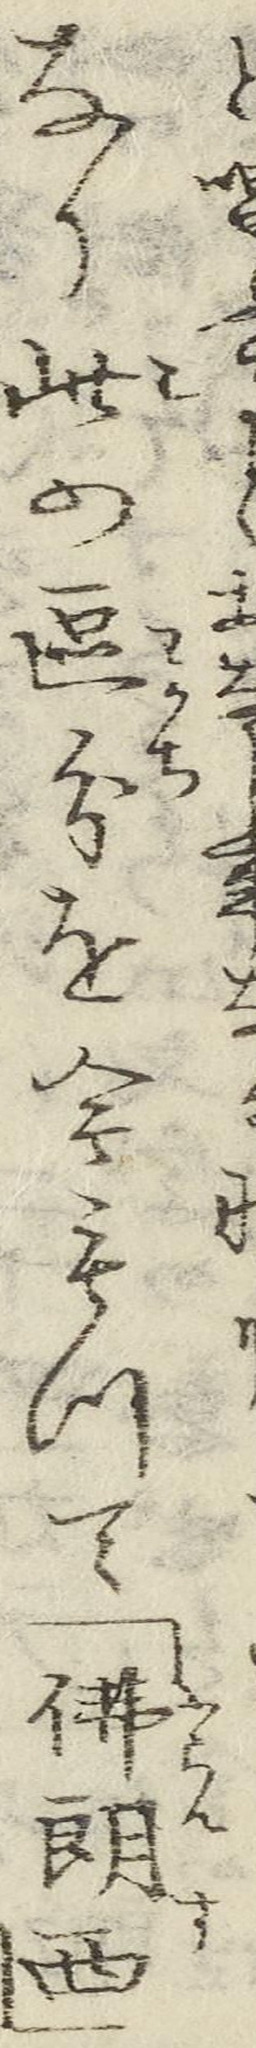なり此の区分を今もつて「仏朗西」
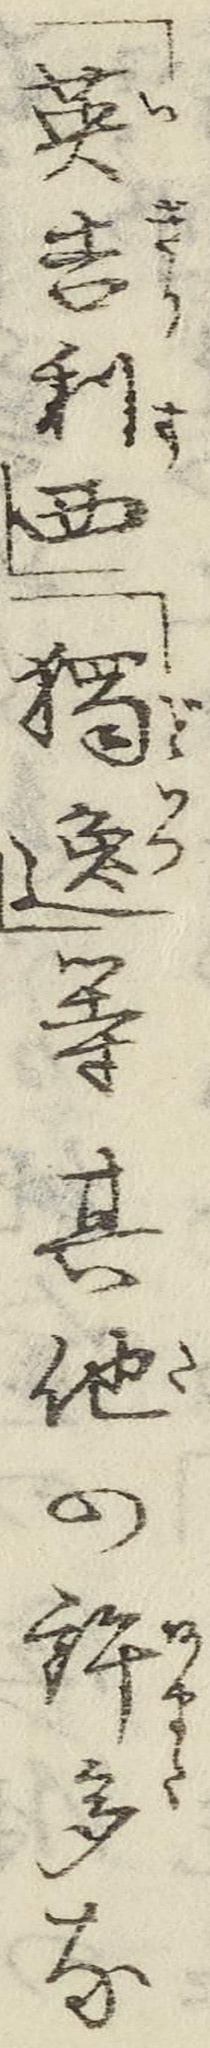「英吉利西」「独逸」等其他の許多な
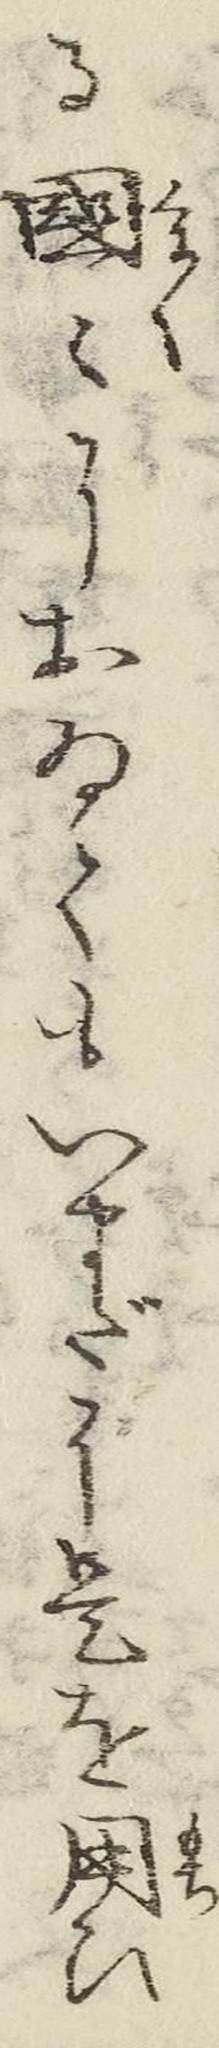る国〻におゐてもいまだに是を用ひ
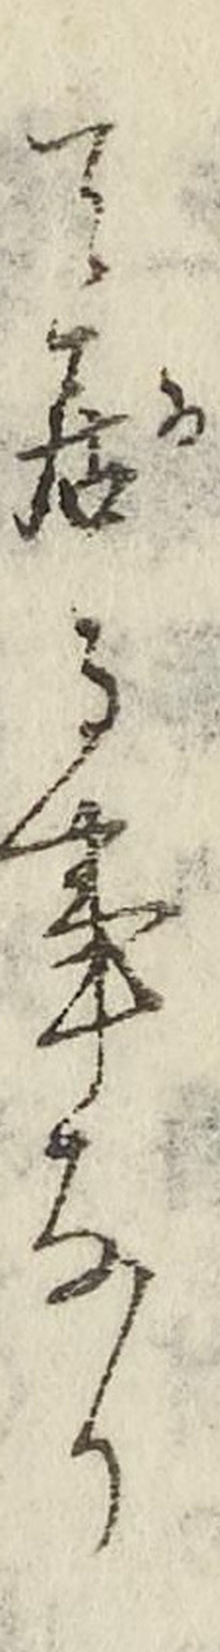て居る事なり
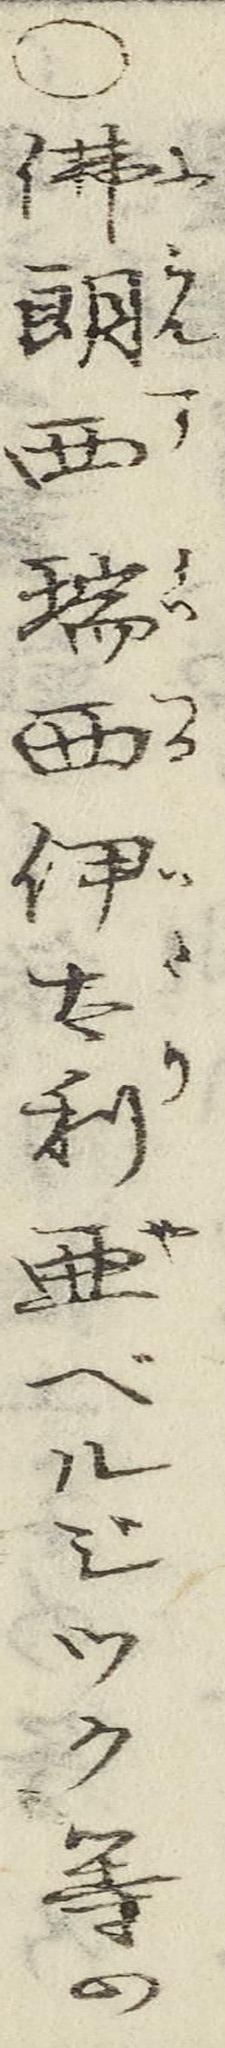仏朗西瑞西伊太利亜ベルジツク等の
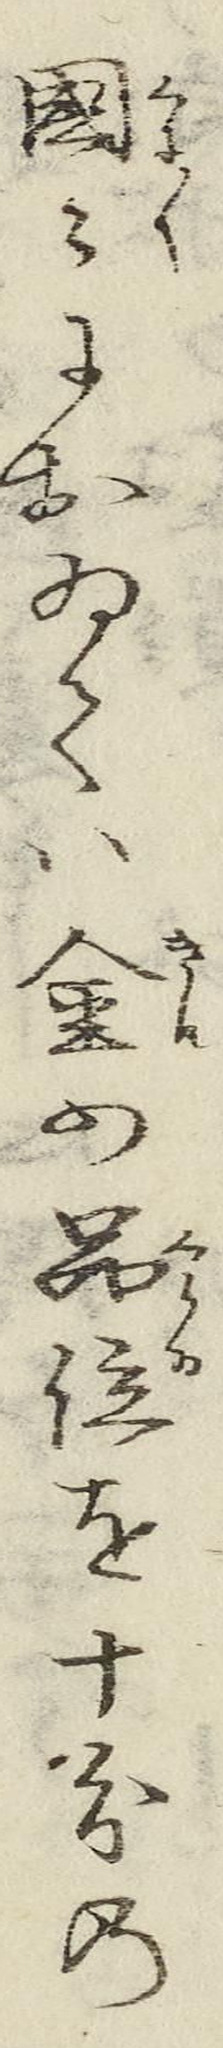国〻におゐては金の品位を十分の
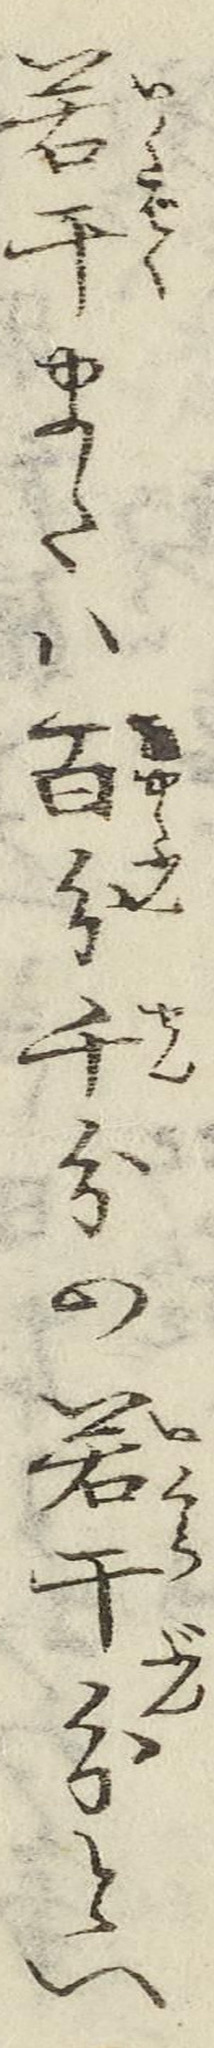若干または百分千分の若干分とい
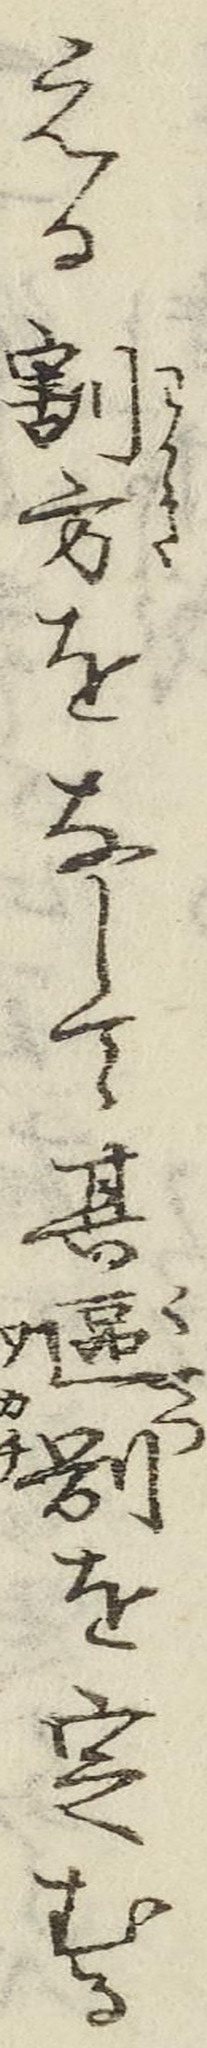える割方をなして其区別を定むる
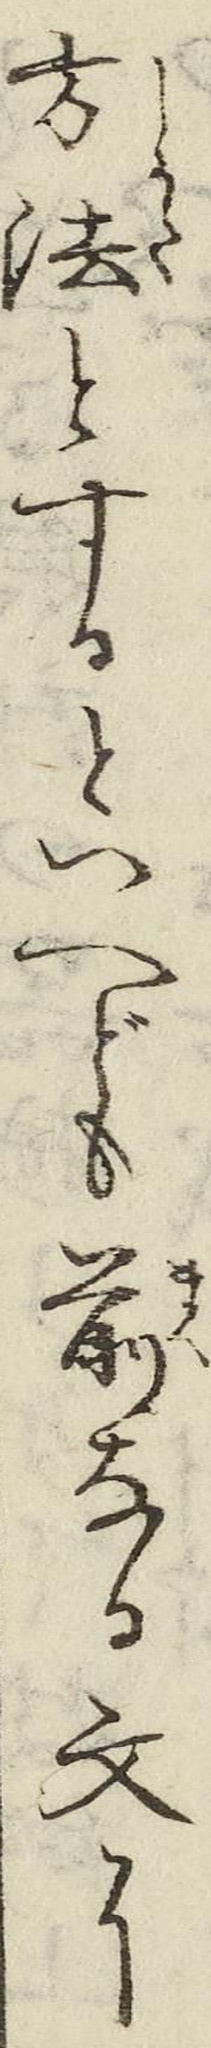方法とするといへども前なる文に
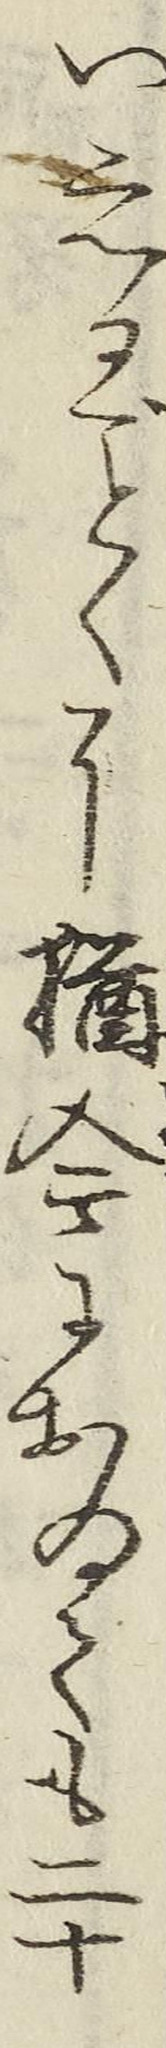いえるごとくに猶今におゐても二十
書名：[時計に関する冊子]
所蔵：東京大学地震研究所図書室 Earthquake Research Institute Library, The University of Tokyo, JAPAN
